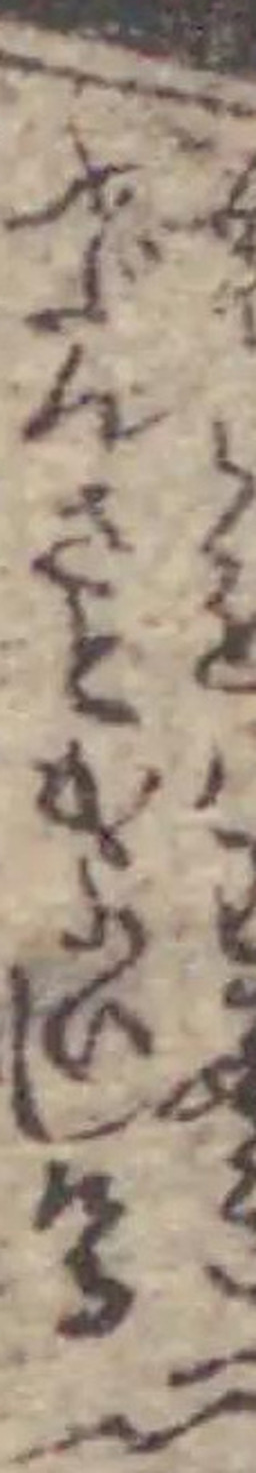ふだんさとかよいしける
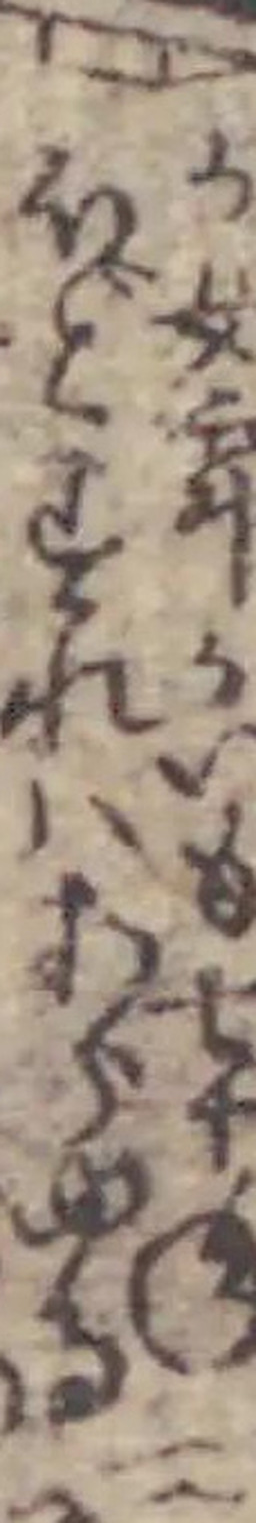ほどすれはあらゆる
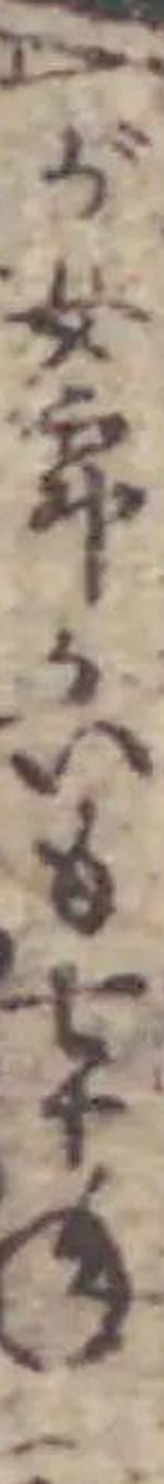が女郎かいも七千年
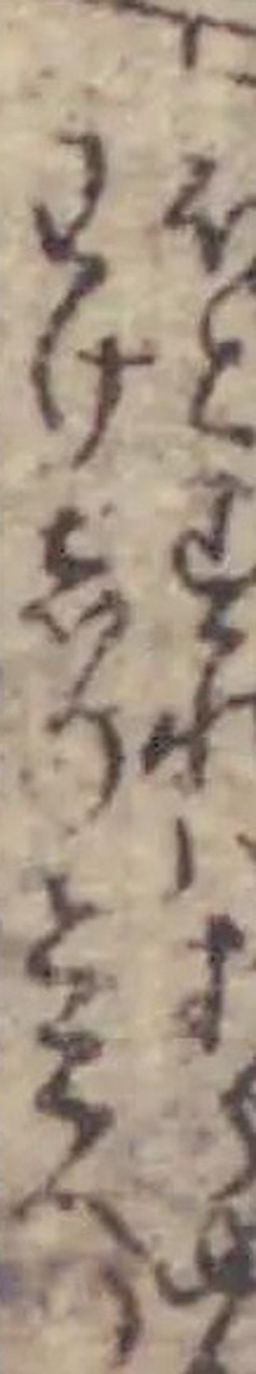わけしりとこへいつ
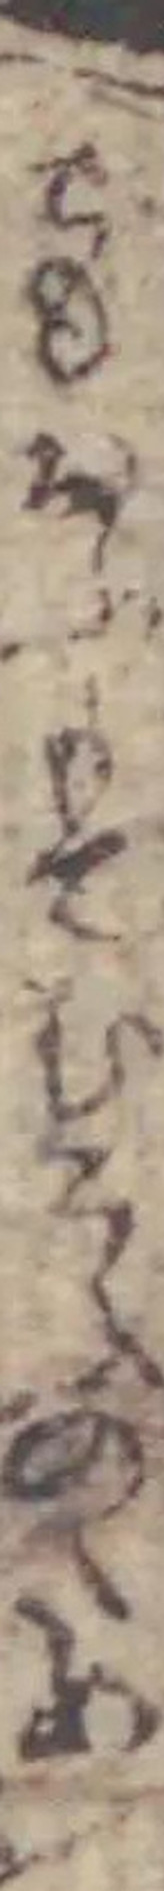てもおふもてむこ入のため
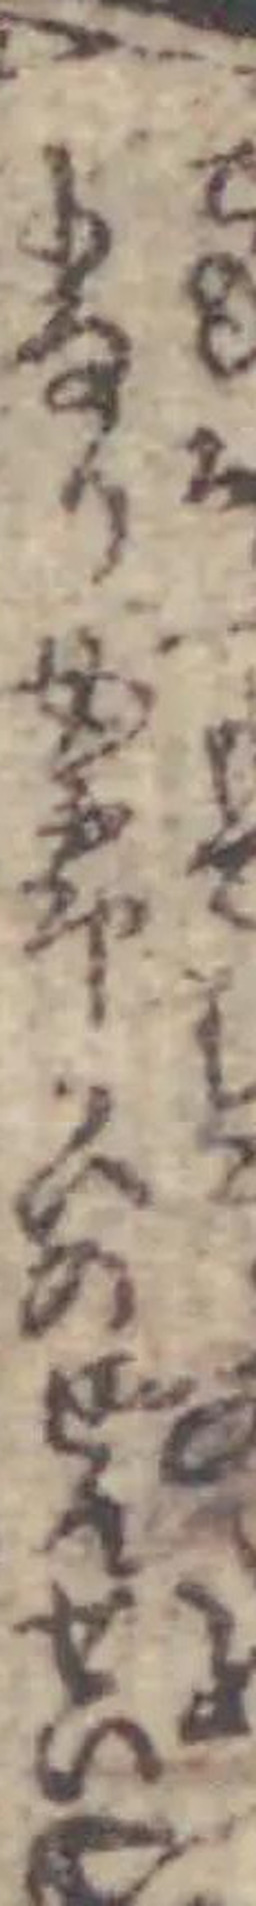になり女郎かいのせんせい
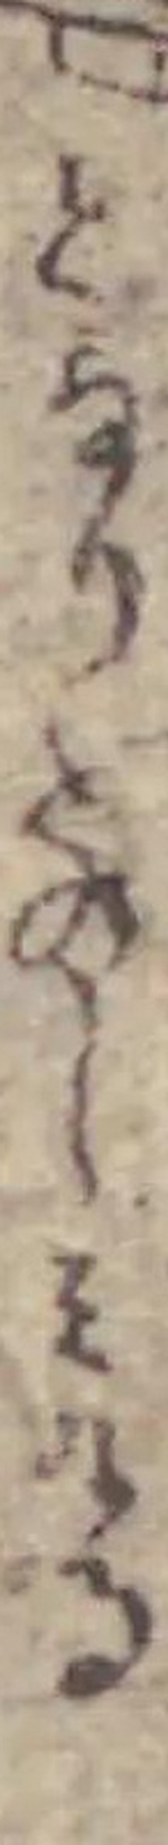となりとのしみける
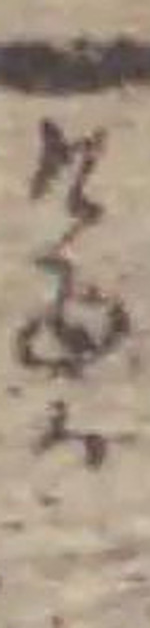けるか
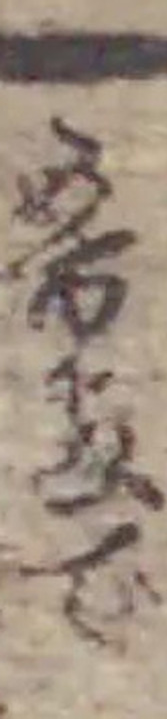五百両で
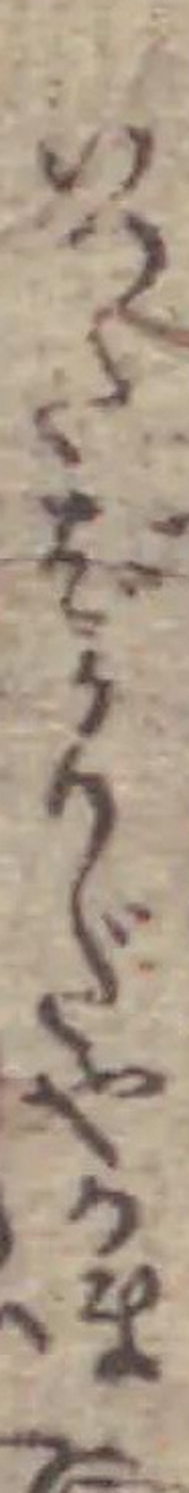いつたばかりだやかま
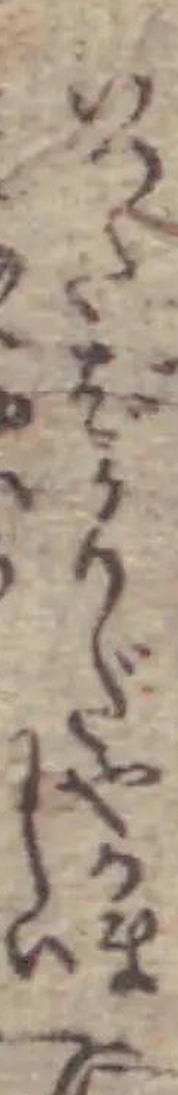いつたばかりだやかま
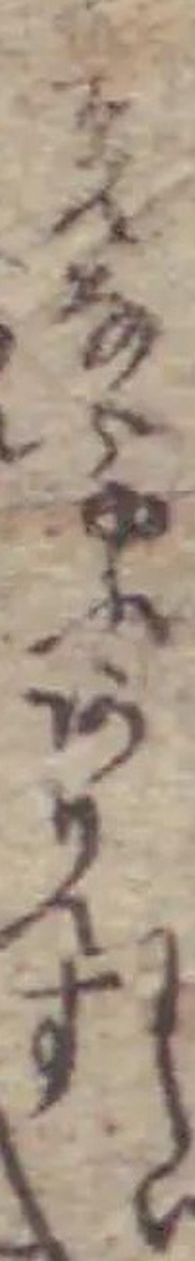んならやふありんす
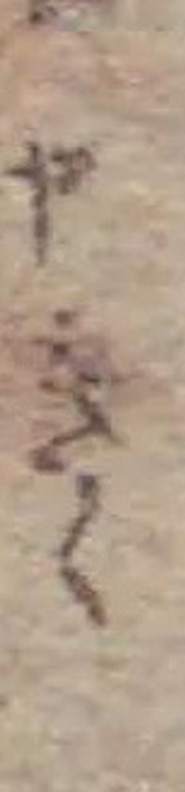申きく
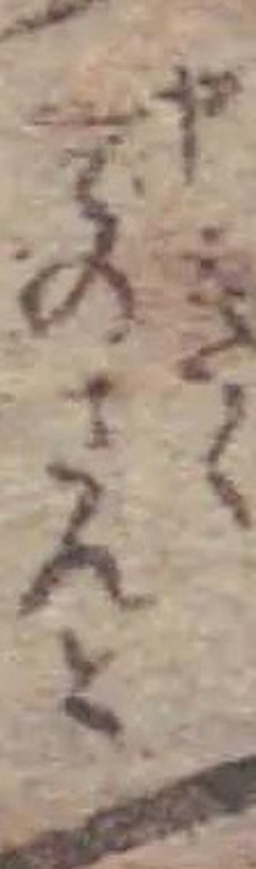てのさんと
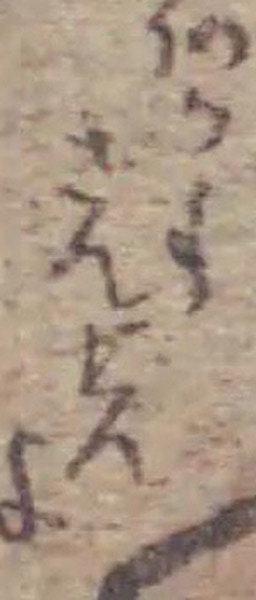さんせん

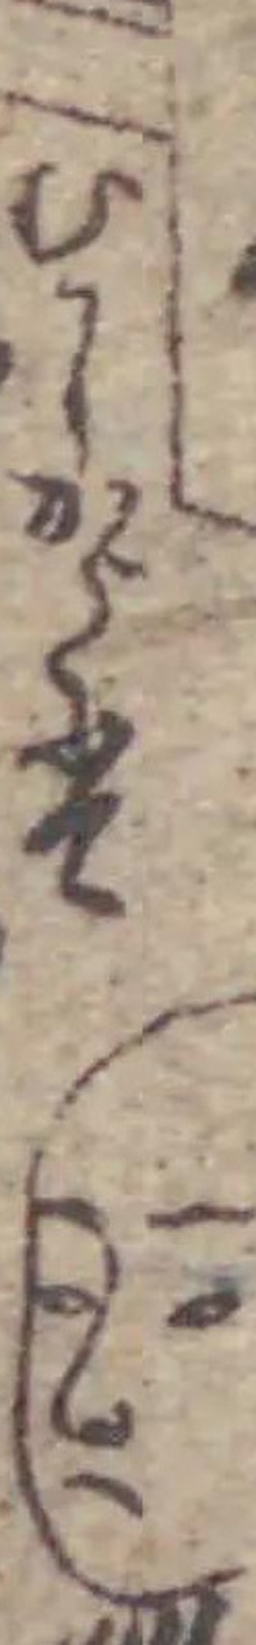むかしからにて
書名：日待御利生此ごろ噂 3巻
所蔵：国立国会図書館 National Diet Library, JAPAN
